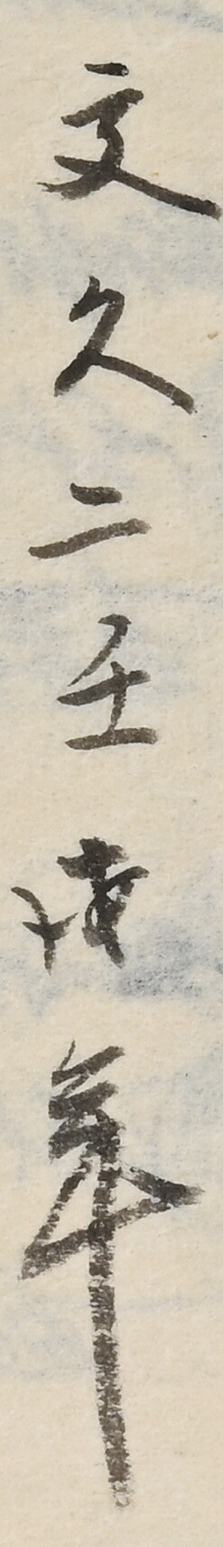文久二壬戌年
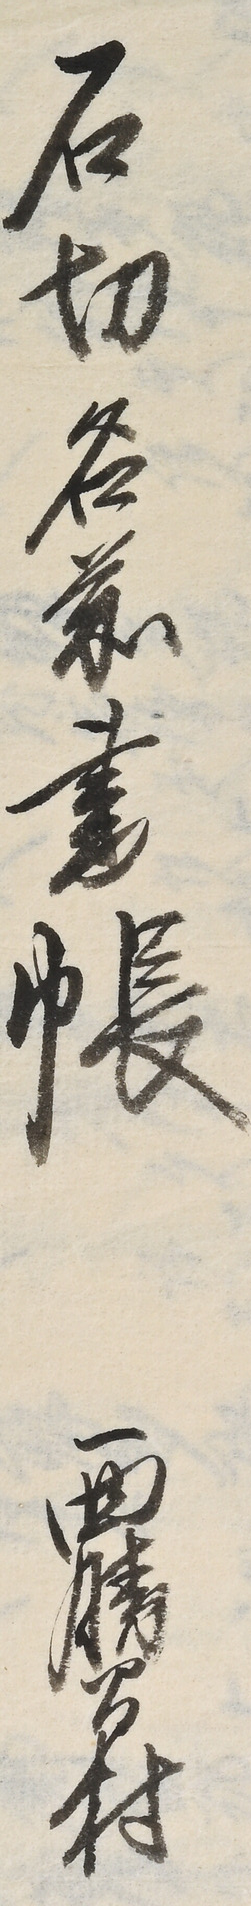石切名前書帳西勝間村

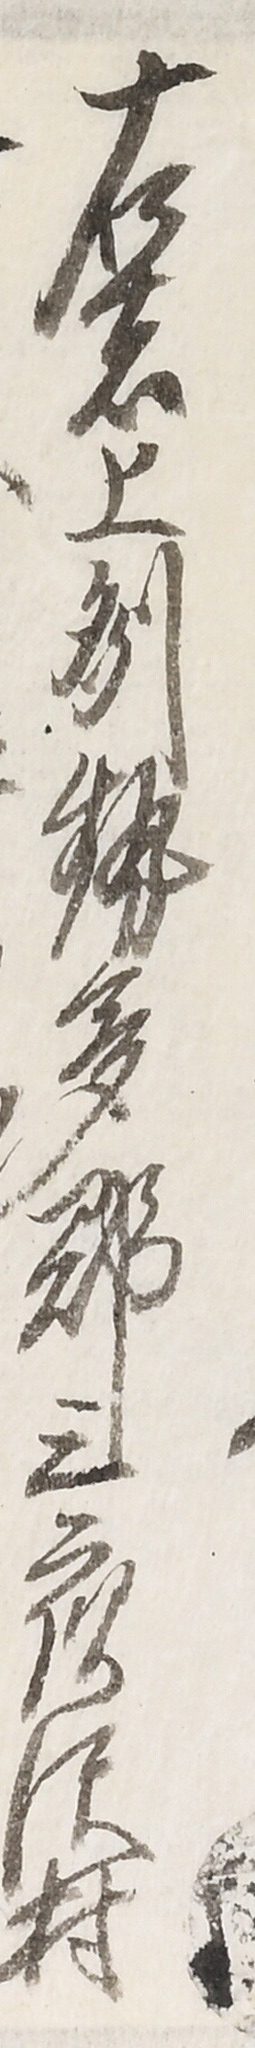右者上州勢多郡三夜沢村
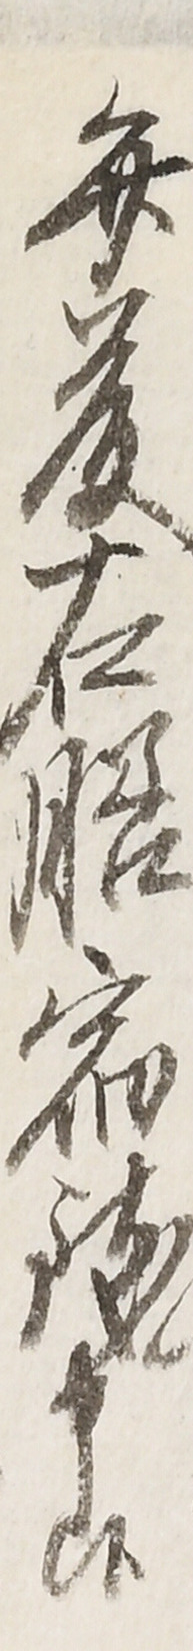斎藤右膳宿致申候
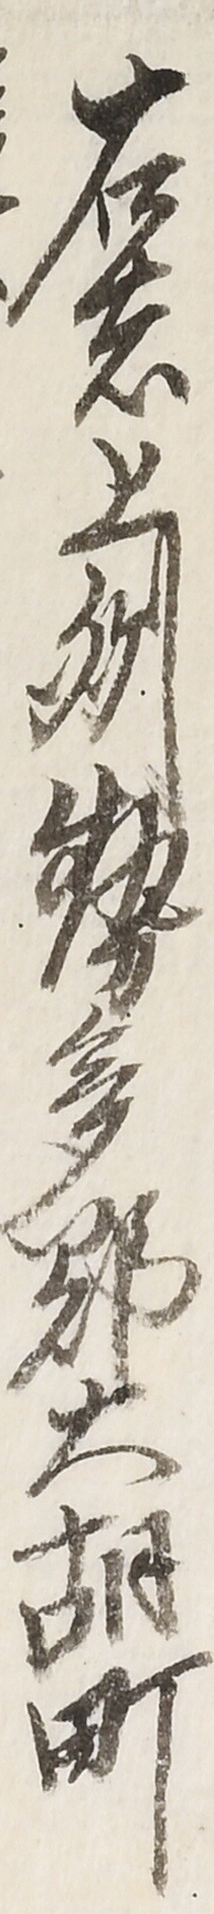右者上州勢多郡大胡町
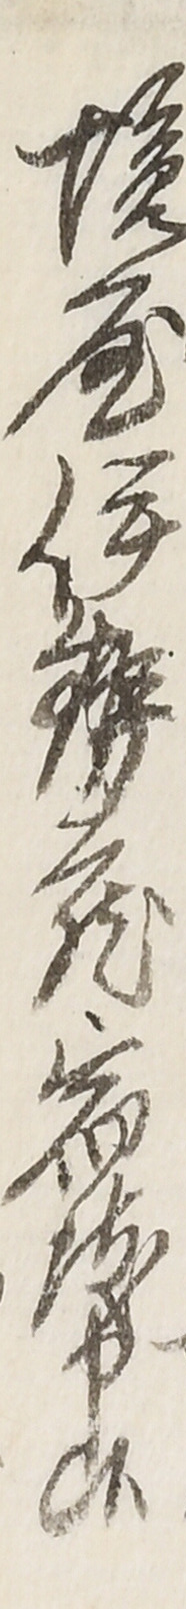境屋伊勢蔵宿致申候
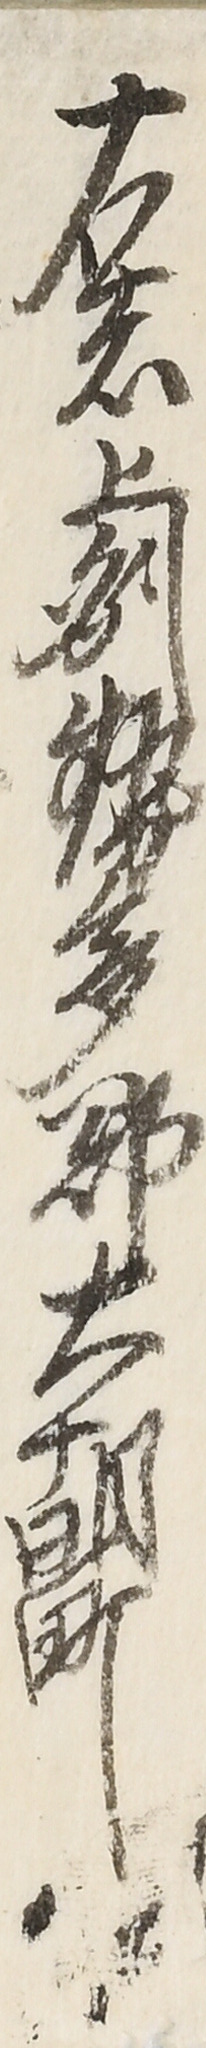右者上州勢多郡大胡町
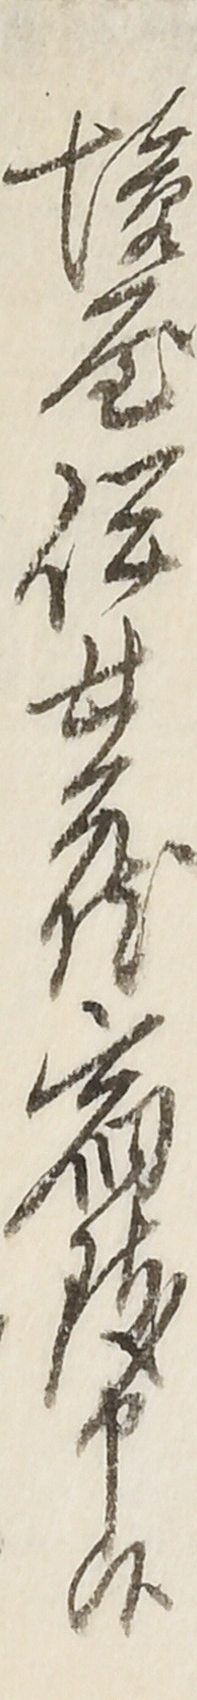境屋伊勢蔵宿致申候
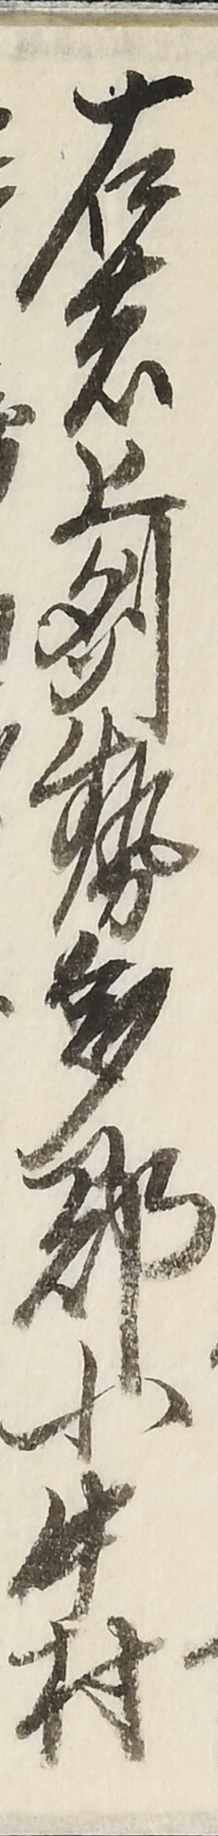右者上州勢多郡小中村
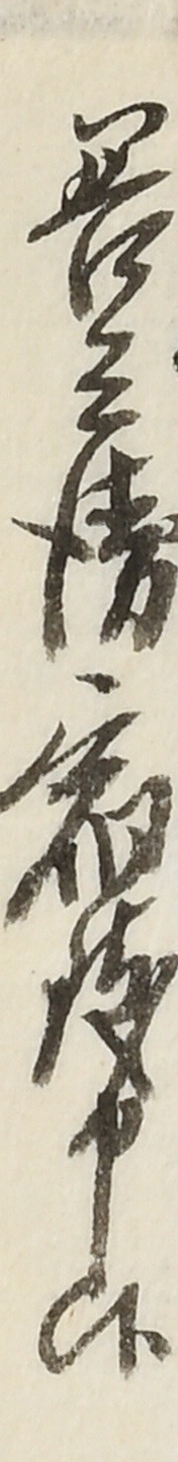善兵衛宿致申候
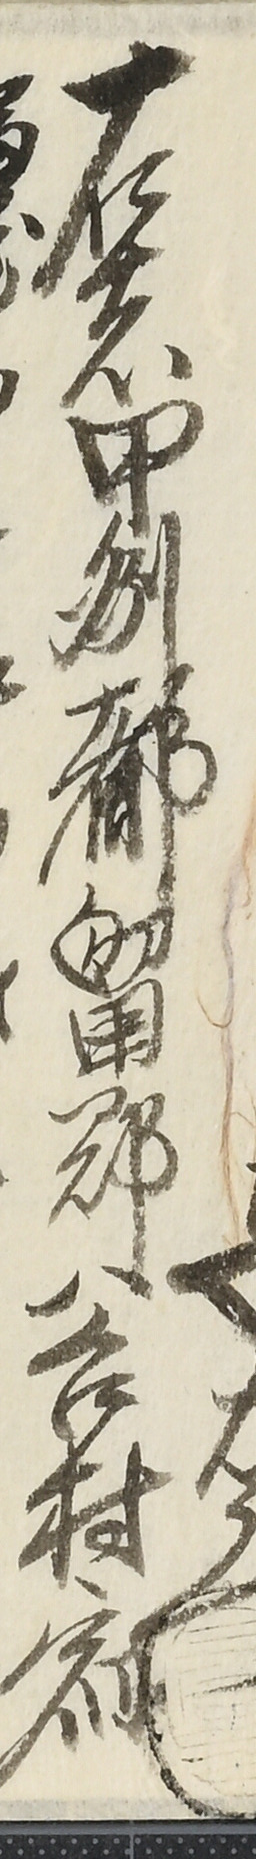右者甲州都留郡谷村宿
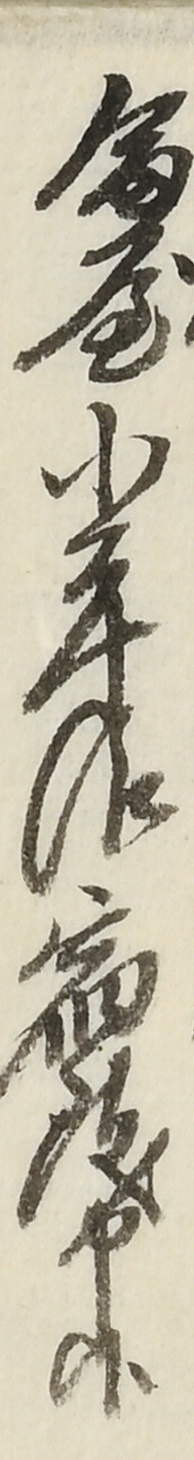富屋小平治宿致申候
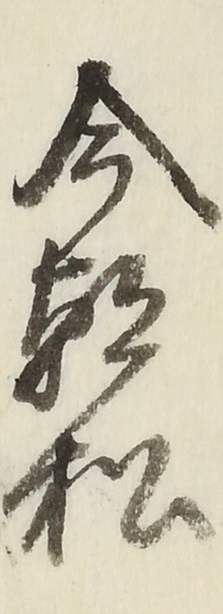今朝松
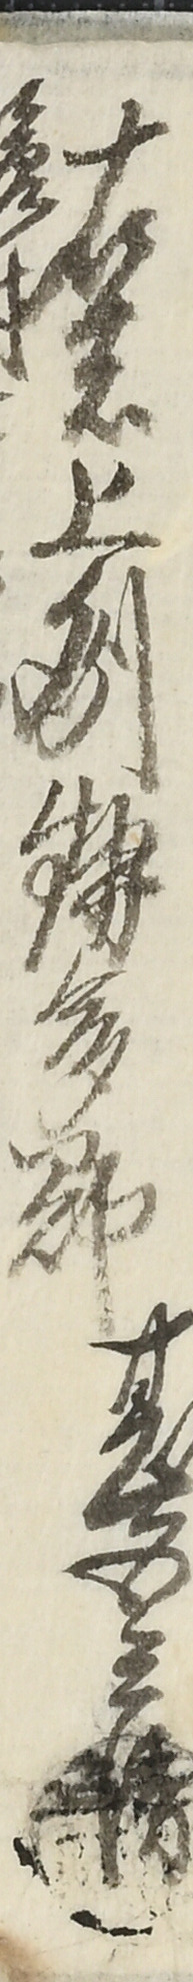右者上州勢多郡大胡町
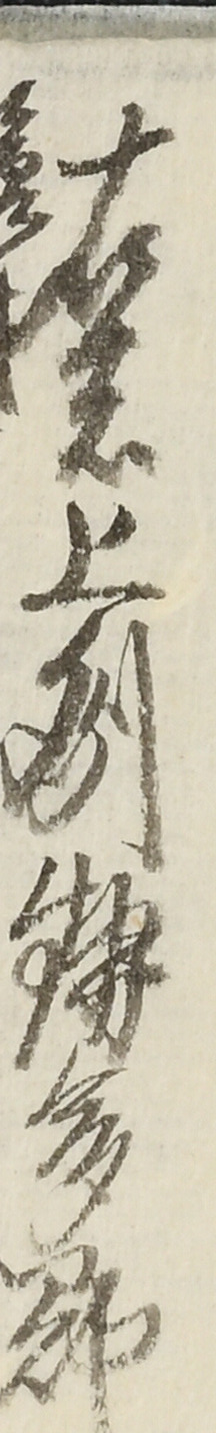右者上州勢多郡

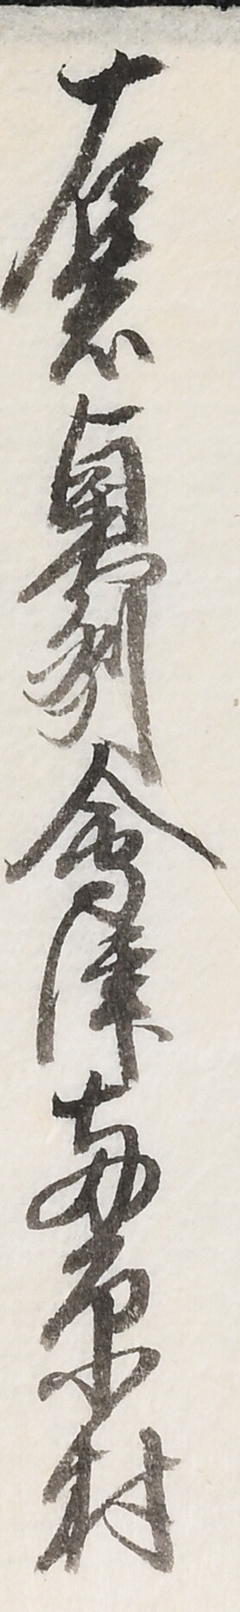右者奥州会津両原村
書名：文久二壬戌年正月石切名前書帳
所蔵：伊那市立高遠町図書館・合同会社AMANE
